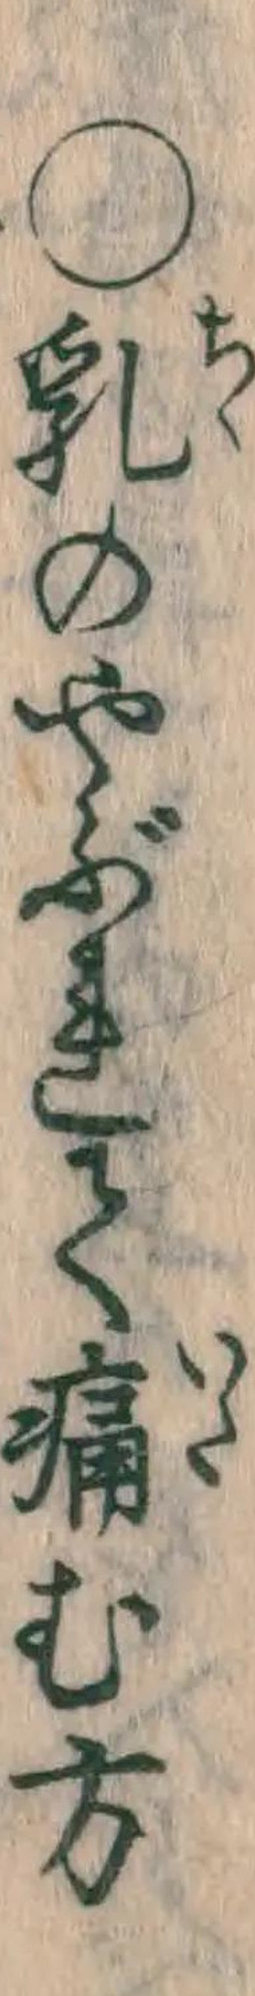○乳のやぶれて痛む方
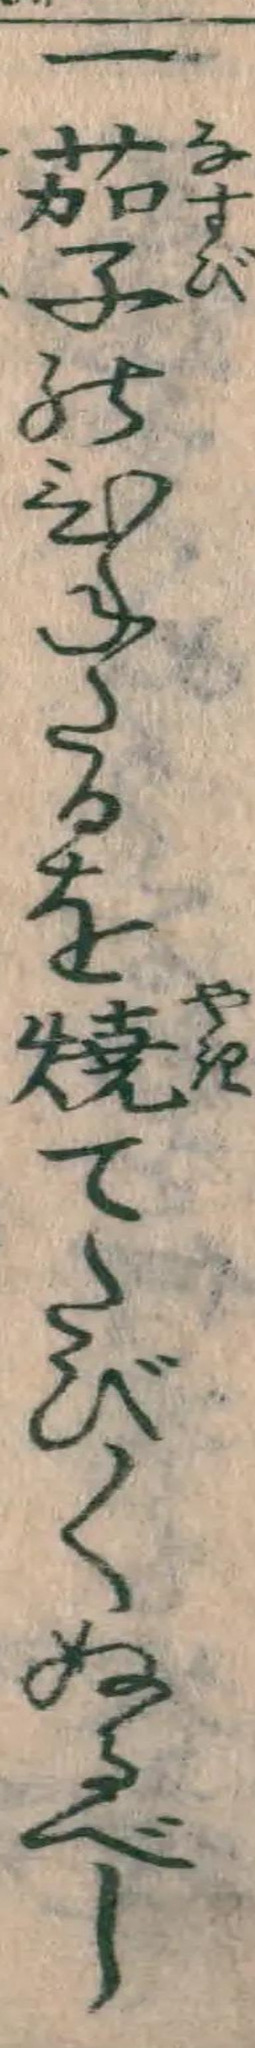一茄子のひねたるを焼てたび〳〵ぬるべし
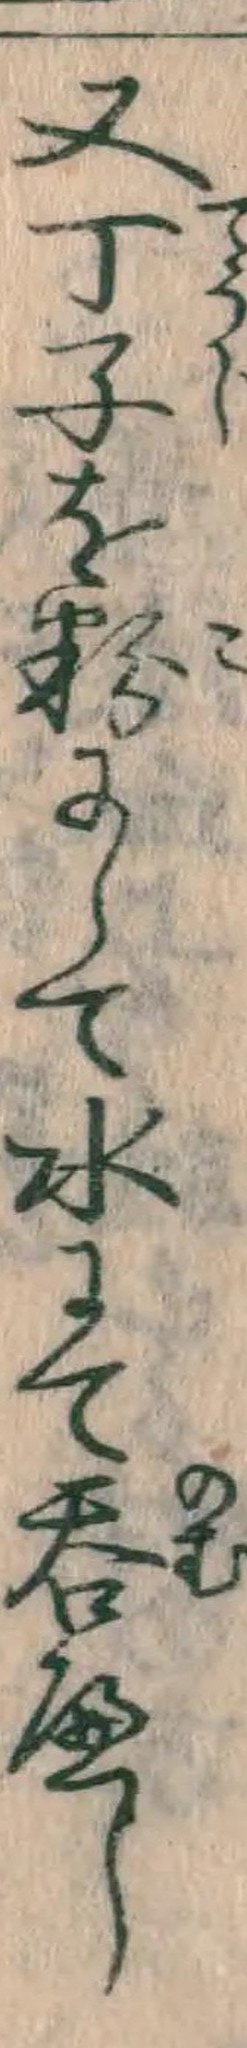又丁子を粉にして水にて呑へし
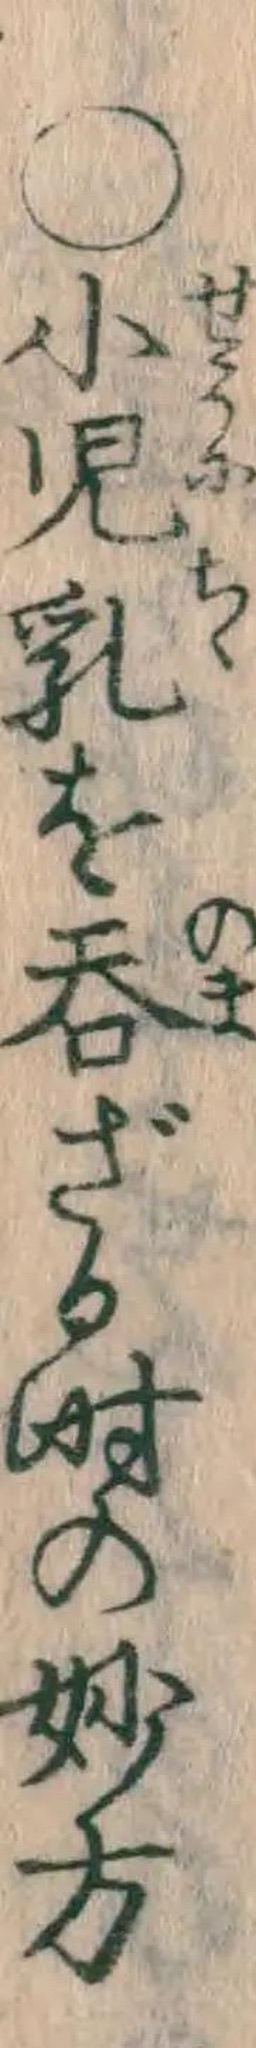○小児乳を呑ざる時の妙方
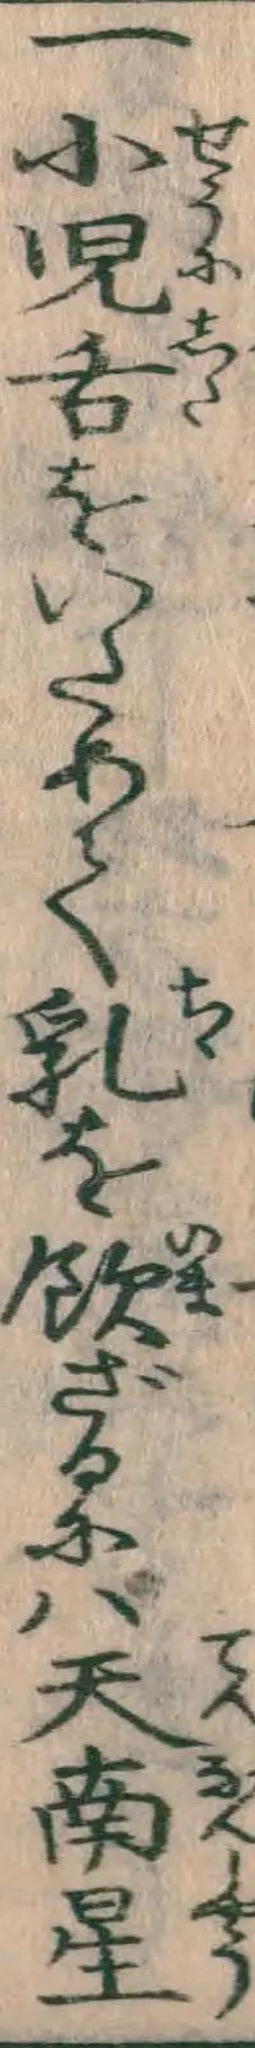一小児舌をいためて乳を飲ざるには天南星
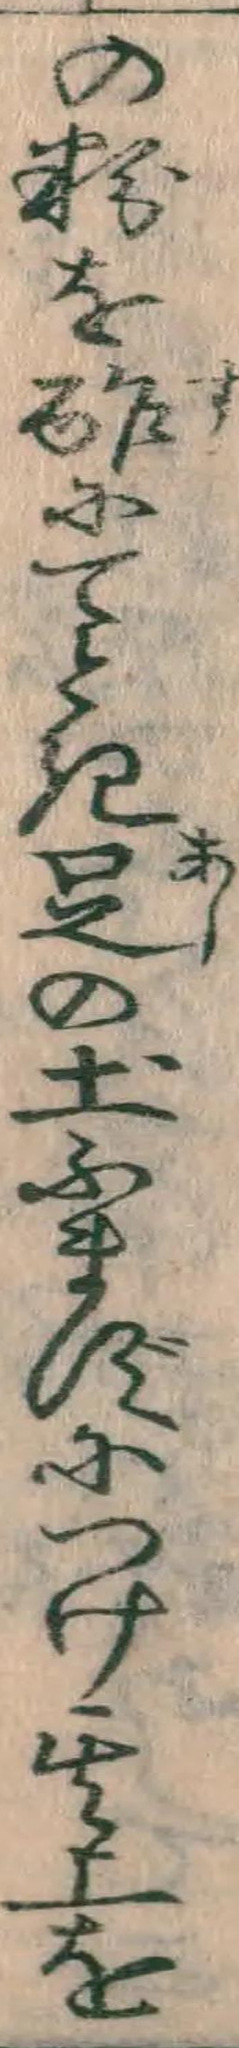の粉を酢にてとき足の土ふまずにつけ其上を
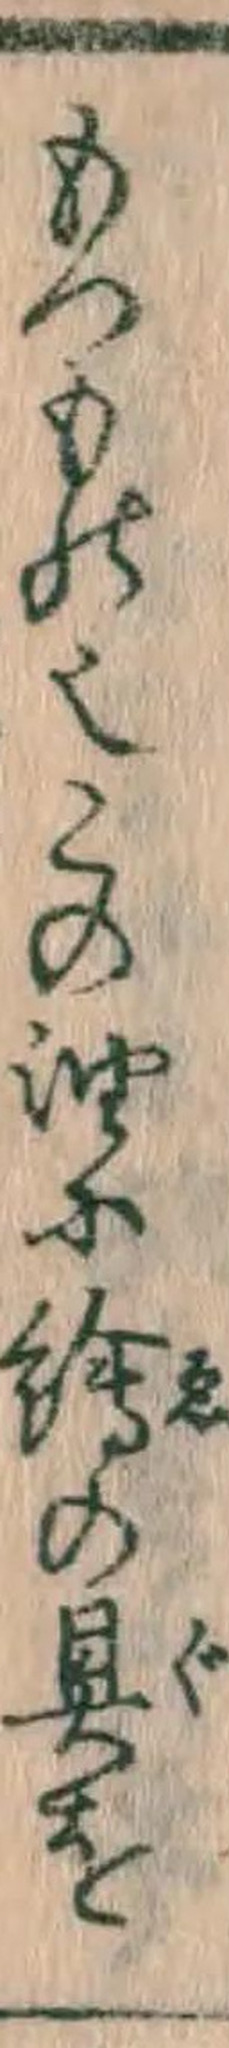もつもの也この油に絵の具を
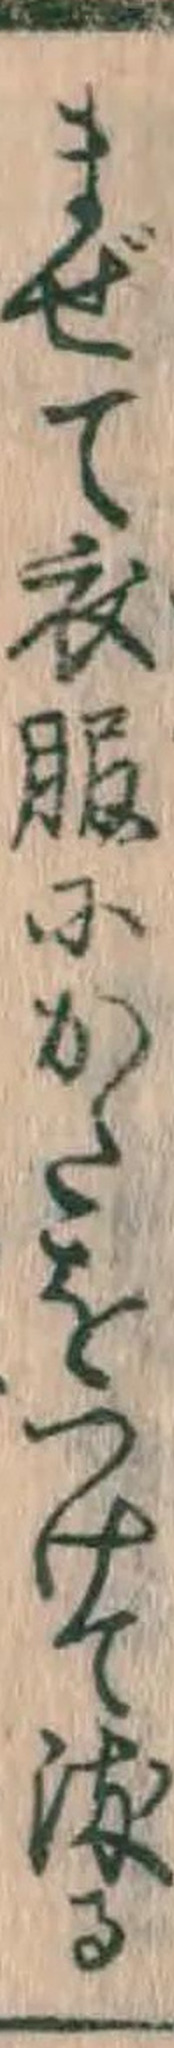まぜて衣服にかたをつけて染る
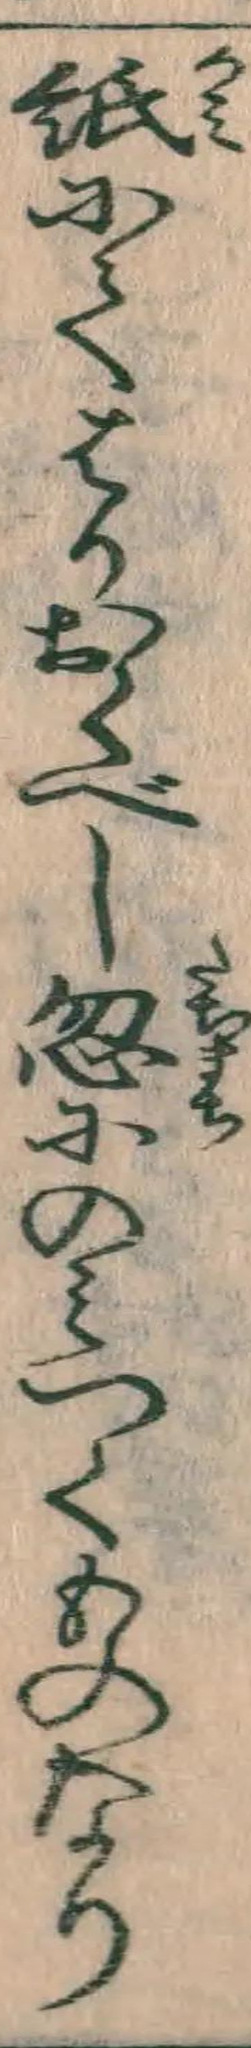紙にてはりおくべし忽にのみつくものなり
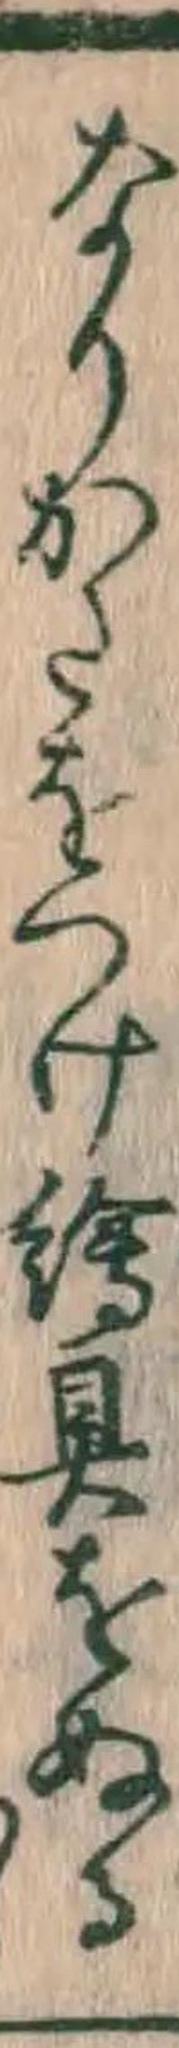なりかたをつけ絵具をぬる
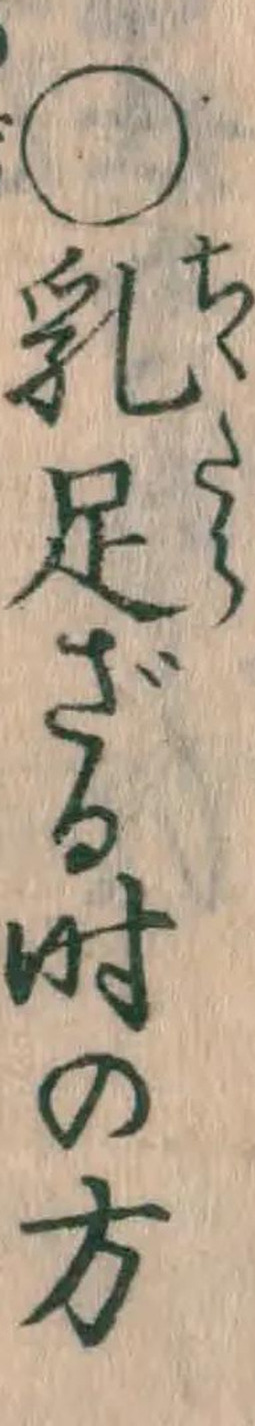○乳足ざる時の方
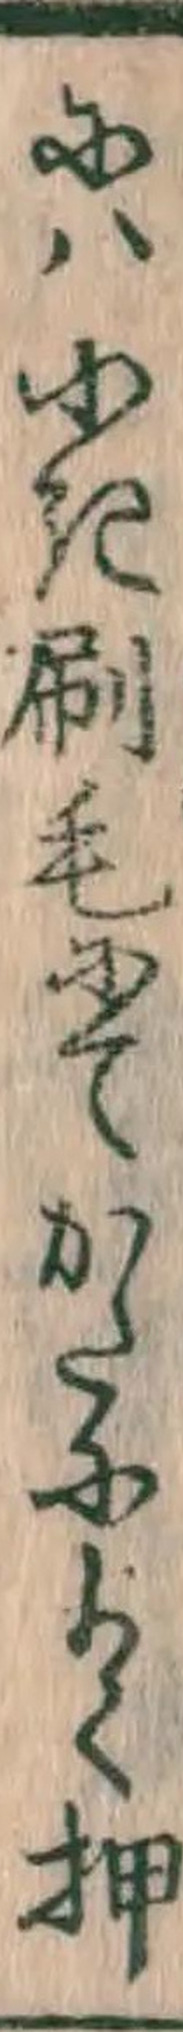には小き刷毛にてかたによく押
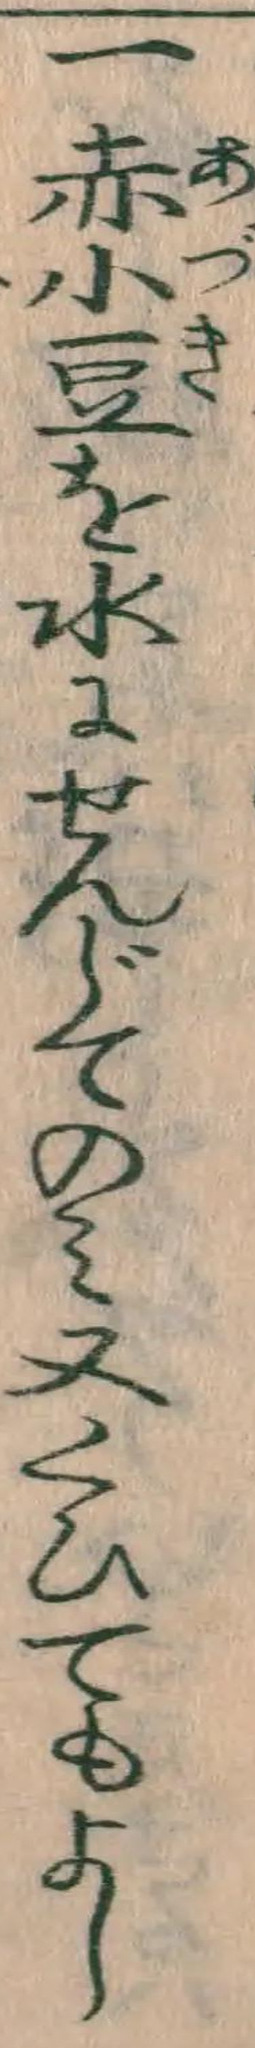一赤小豆を水にせんじてのみ又くひてもよし
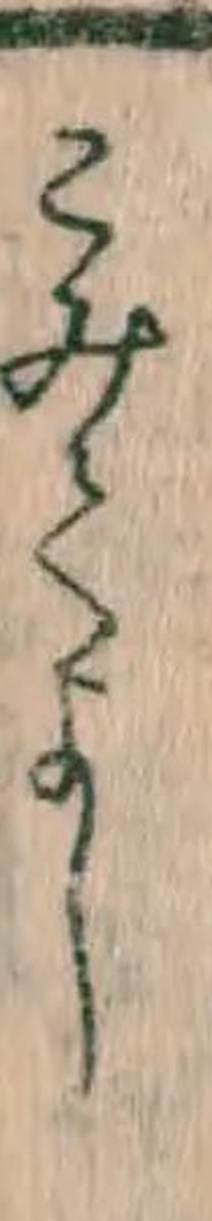こみてよし
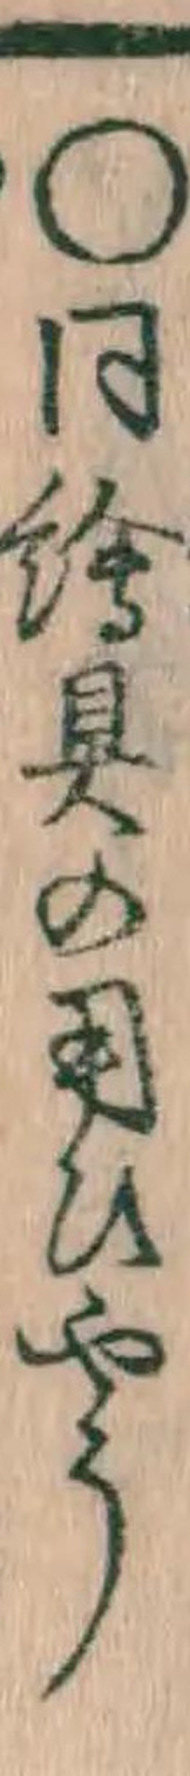○同絵具の用ひやう
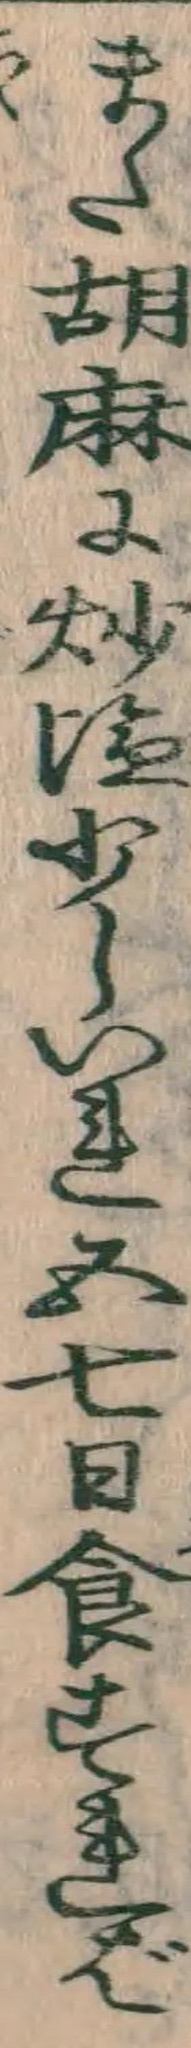また胡麻に炒塩少しいれ五七日食すれば
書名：広益秘事大全 3巻. [3]
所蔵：国立国会図書館 National Diet Library, JAPAN
